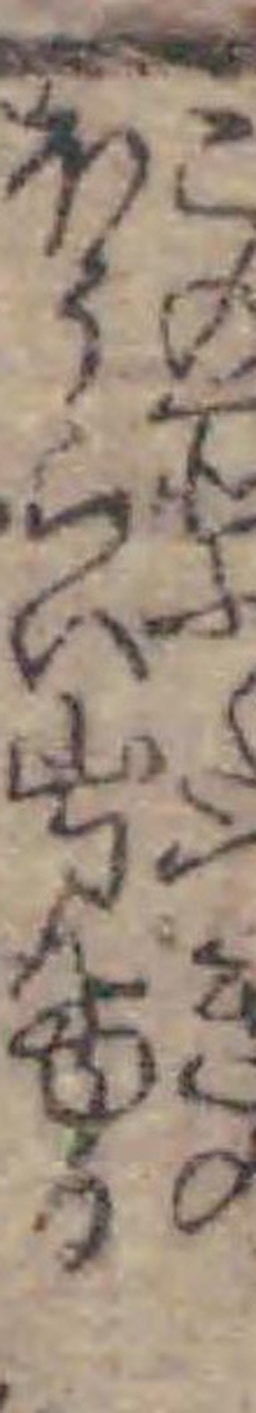ほうらい山見ゆる
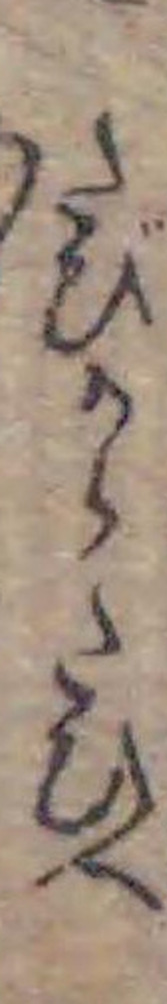たびからたひへ
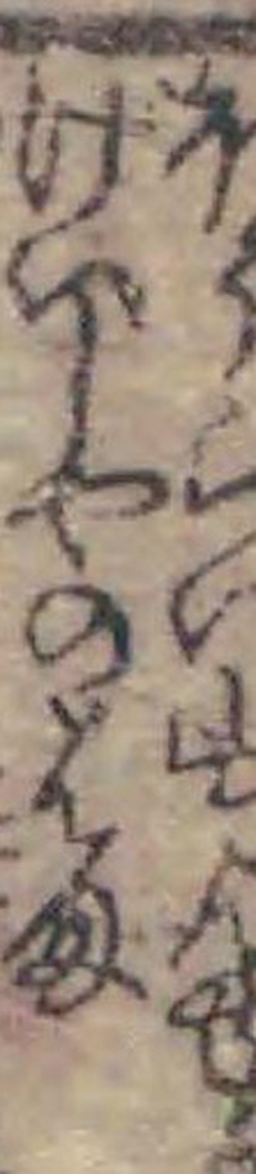げいしやのはま
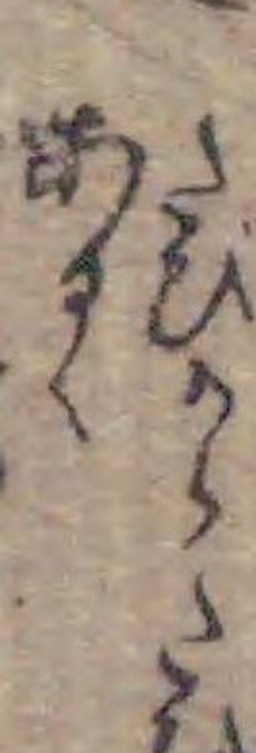あるく
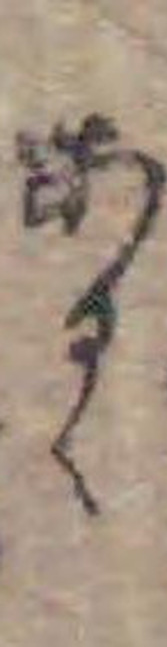あるく
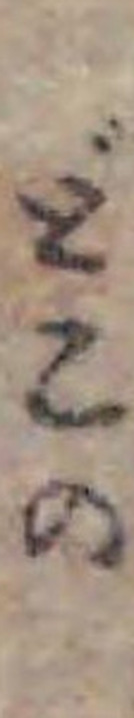どこの
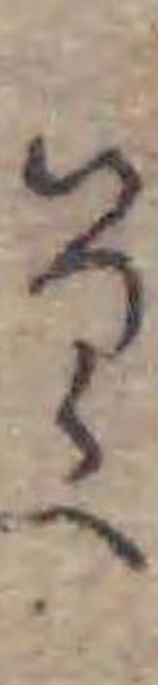いつらへ
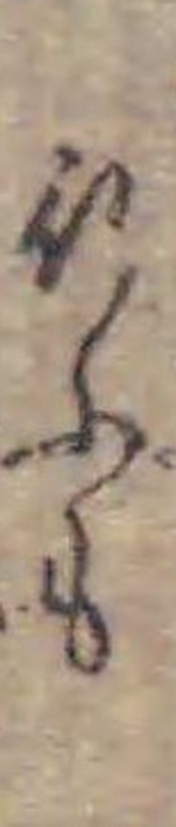行ふも
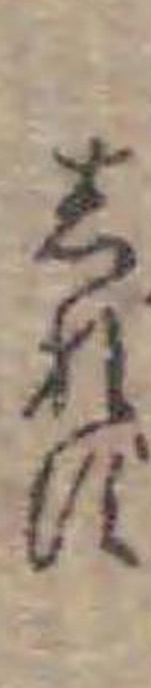しれず
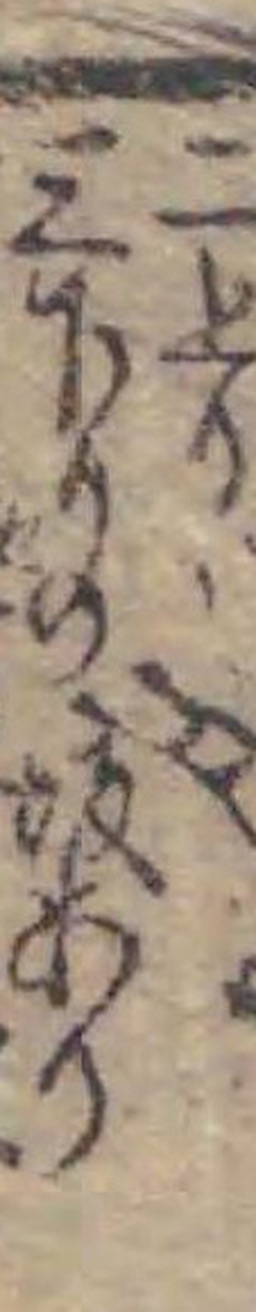三下りの坂あり
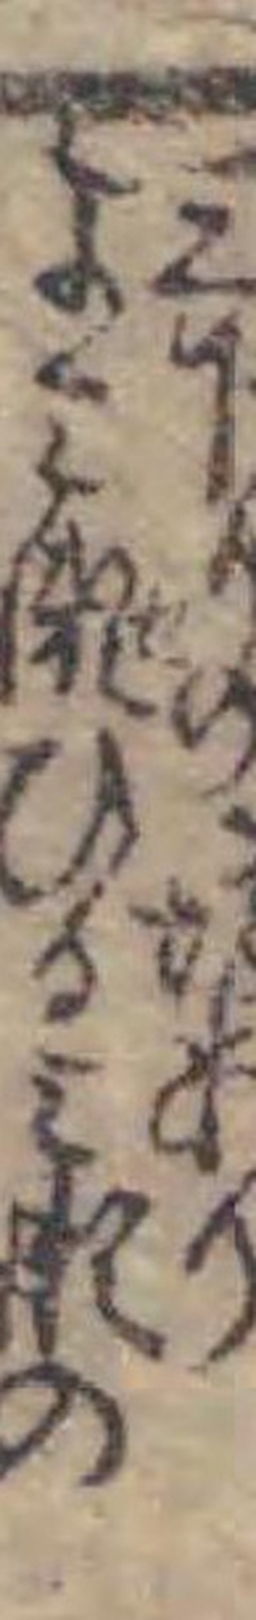よみ瀬ひるみ瀬の
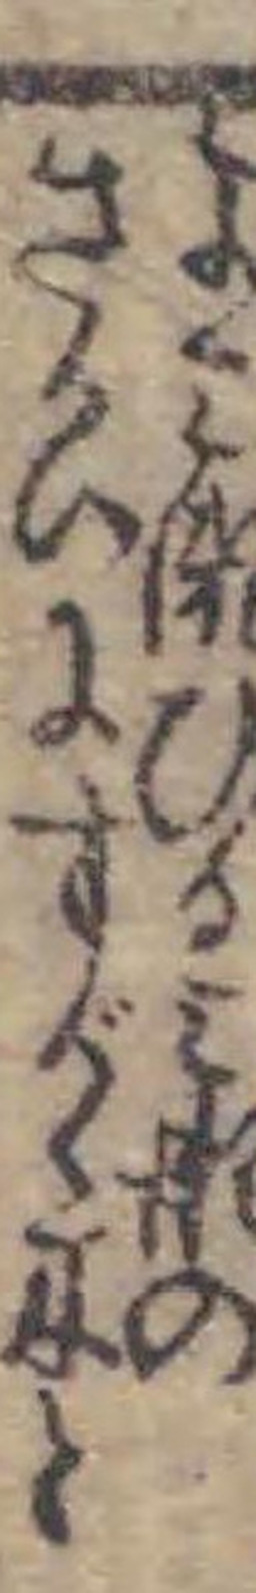さかいにすがゝ木と
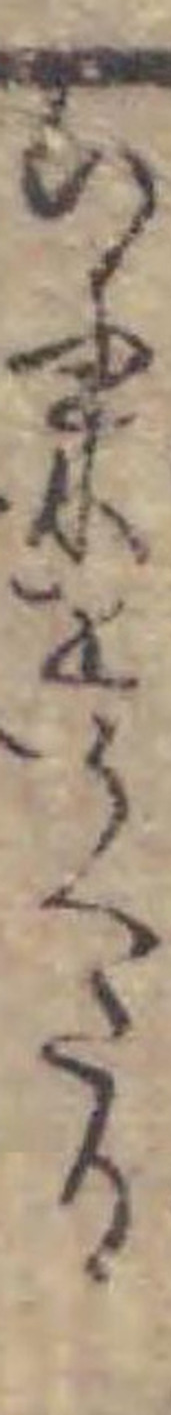いふ木をうへたり

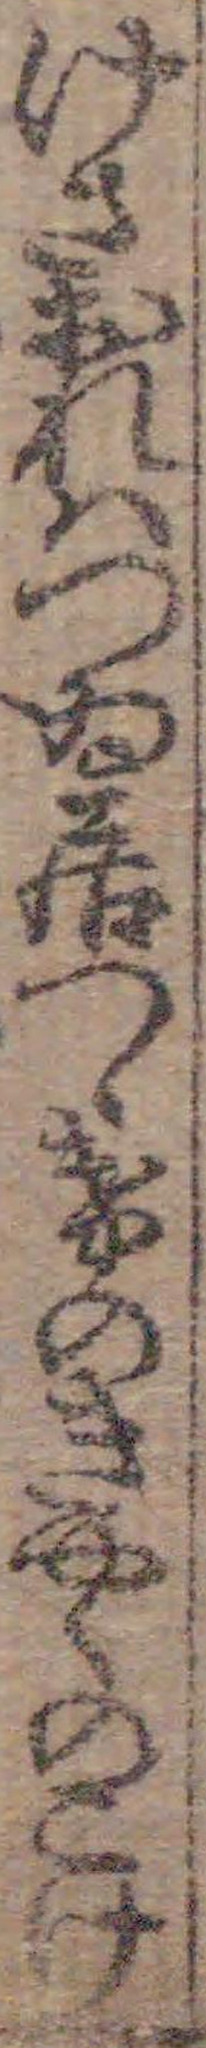けさおれはつゐ居つゝけのきやくのこけ
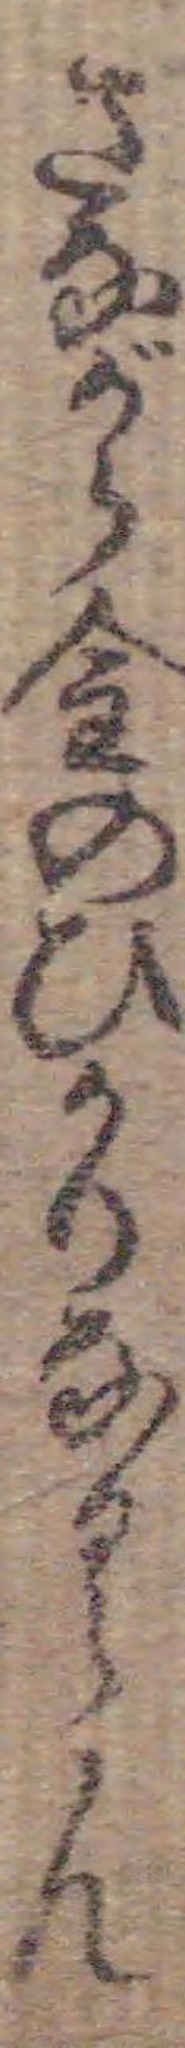さながら金のひかりなるらん
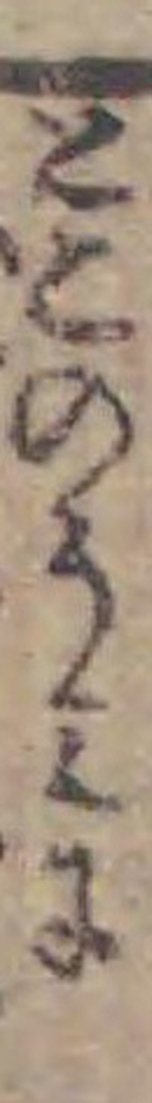とこのうみに
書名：北国順礼唄方便 : 3巻
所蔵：国立国会図書館 National Diet Library, JAPAN
